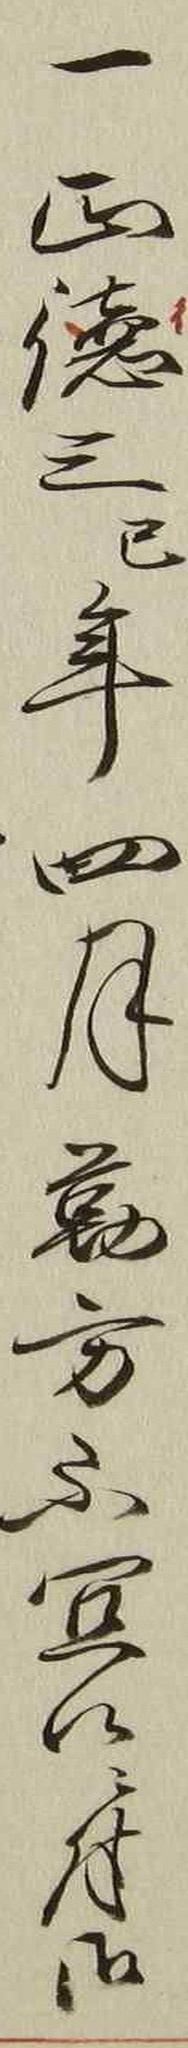一正徳三巳年四月勤方不宜候ニ付御
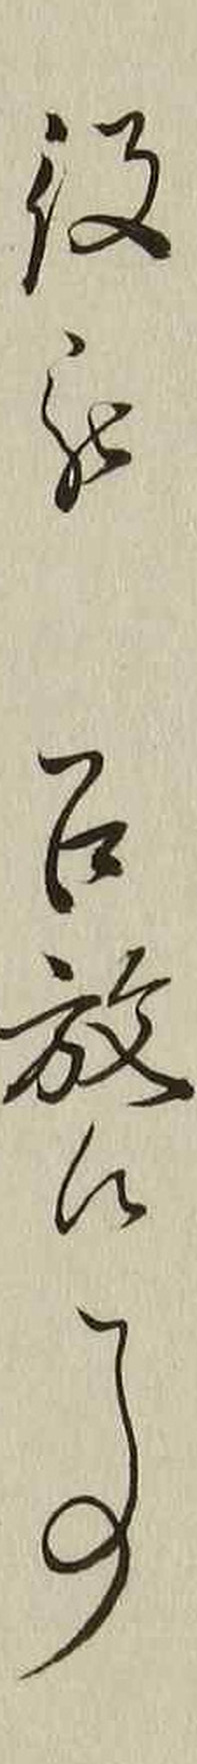役被召放候事
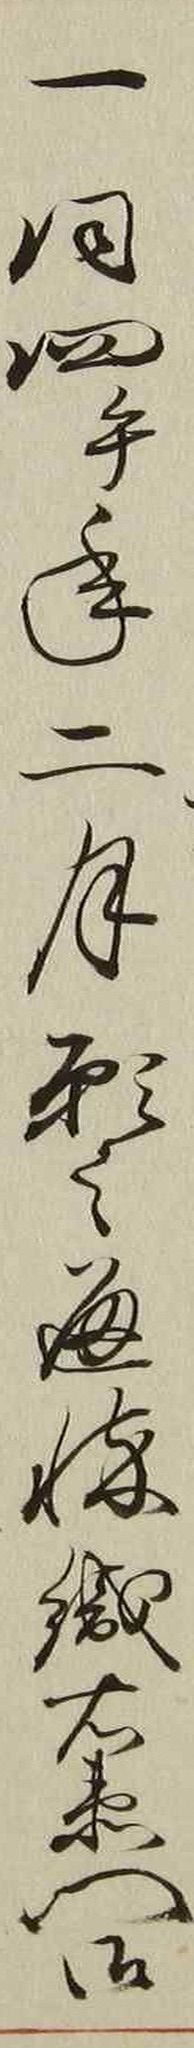一同四午年二月願之通忰織右衛門御
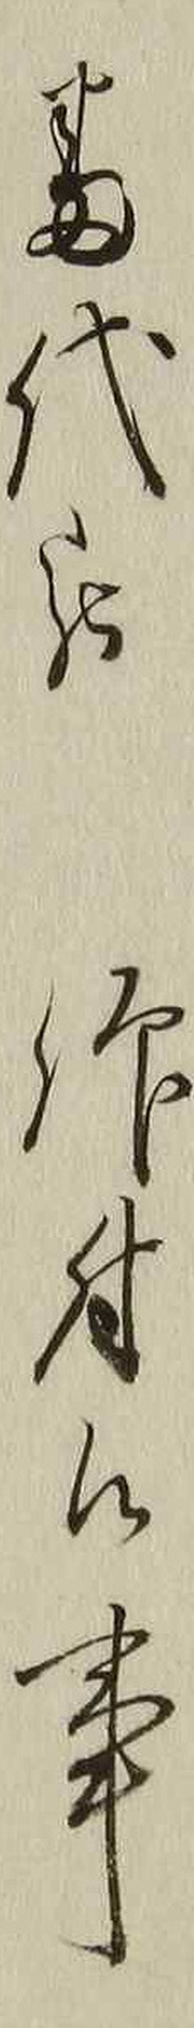番代被仰付候事
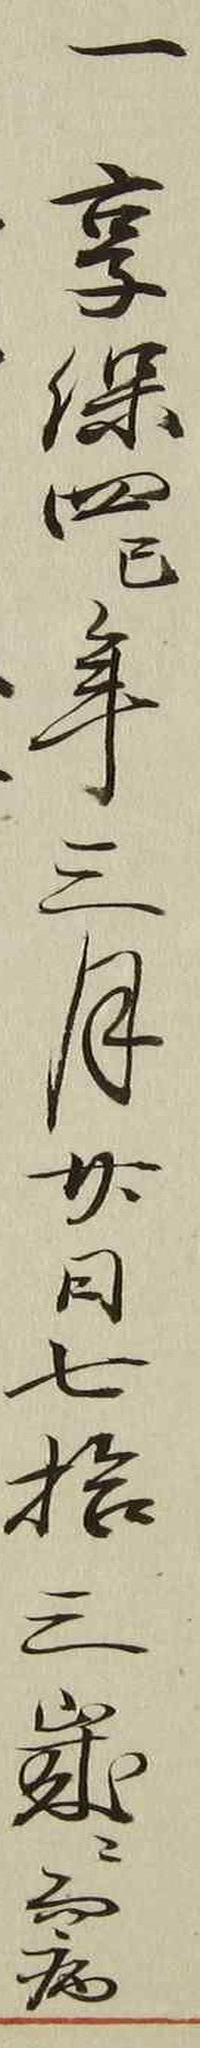一享保四巳年三月廿日七拾三歳ニ而病
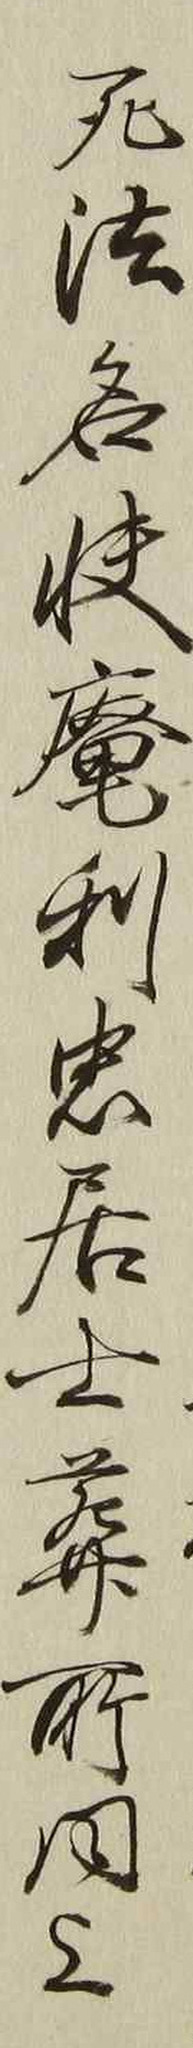死法名快庵利忠居士葬所同上
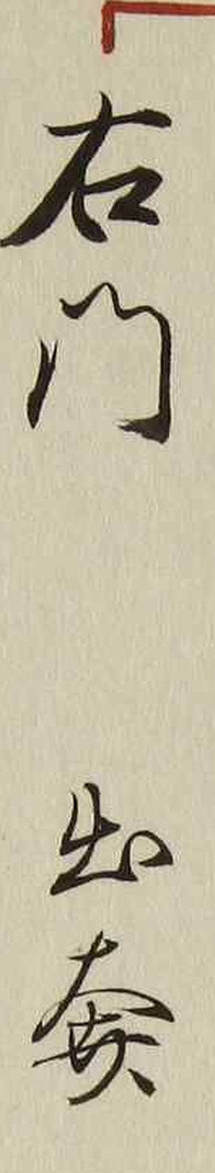右門出奔
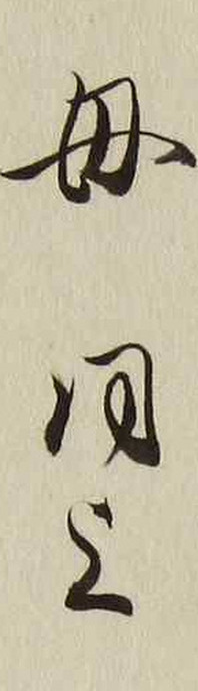母同上
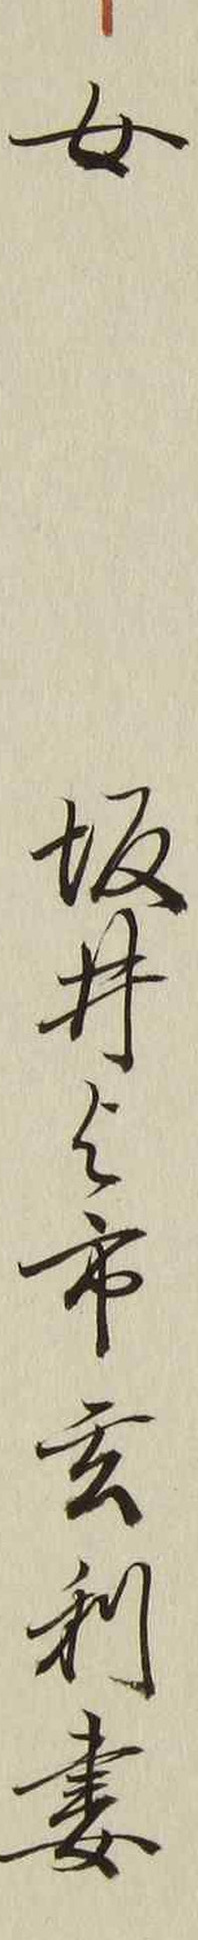女坂井与市玄利妻
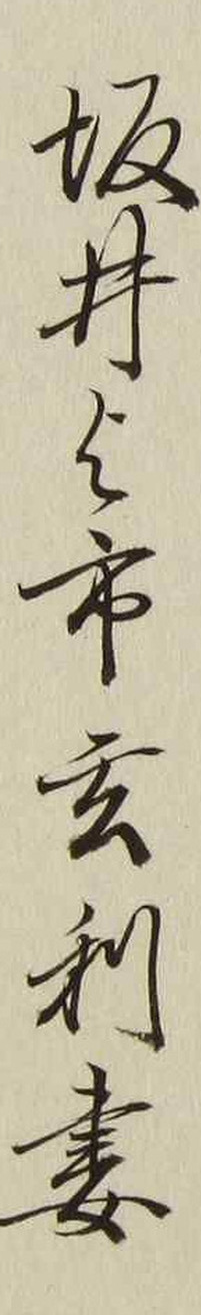女坂井与市玄利妻
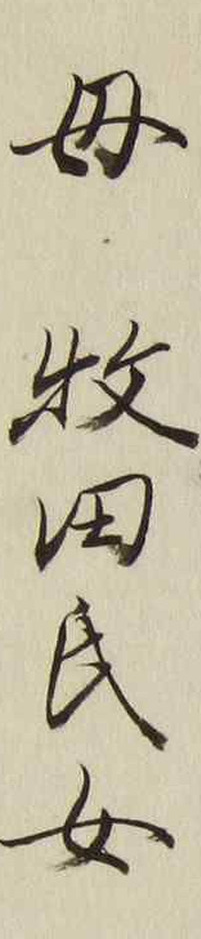母牧田氏女

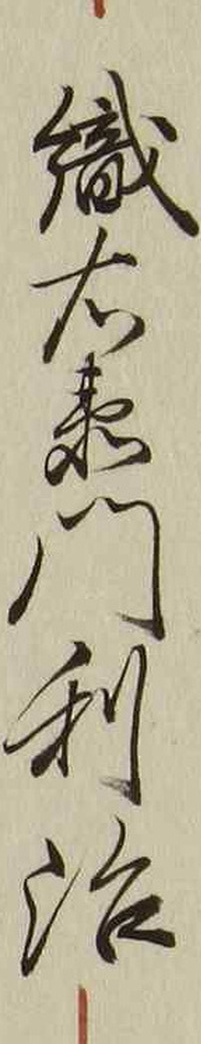織右衛門利治
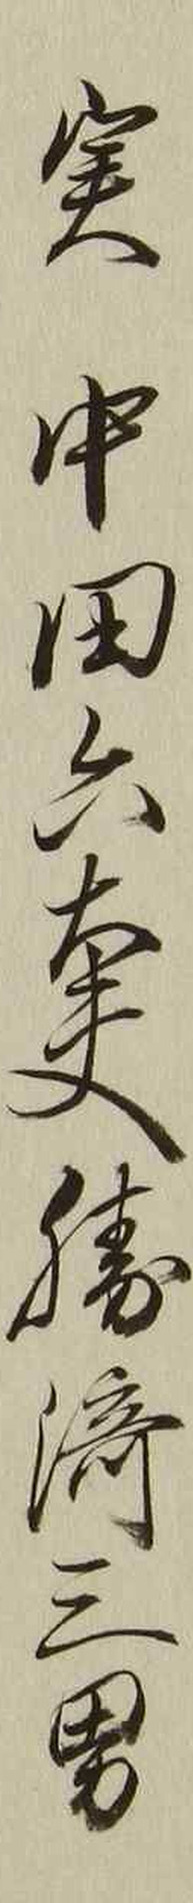実中田六大夫勝倚三男
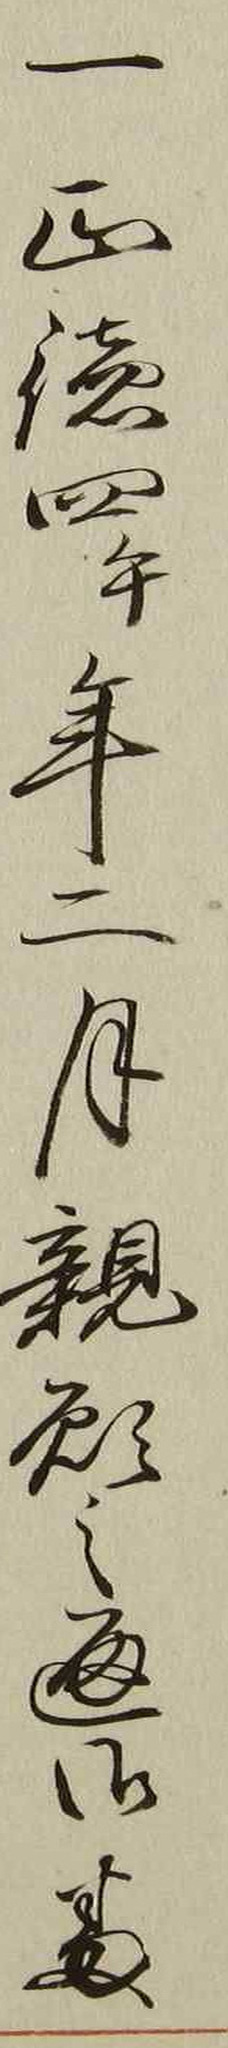一正徳四午年二月親願之通御番
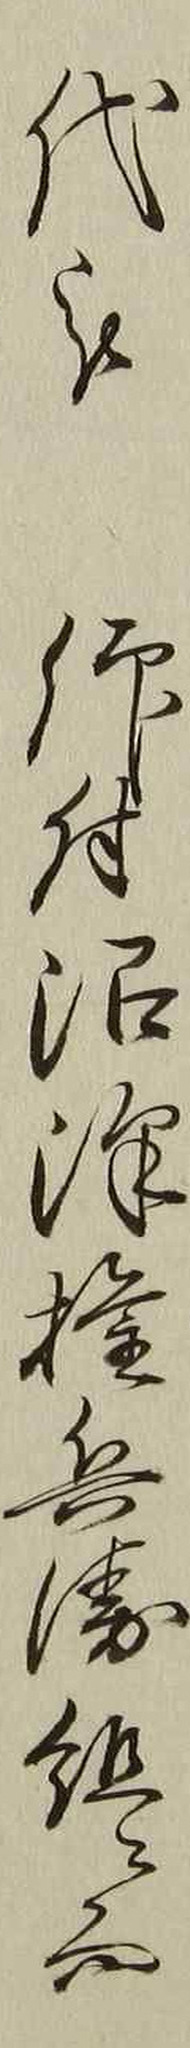代被仰付沼沢権兵衛組ニ而
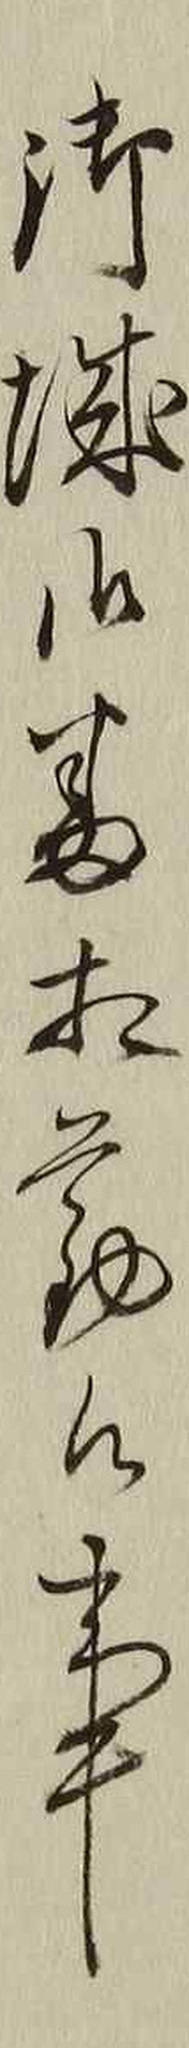御城御番相勤候事
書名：諸士系譜　巻之54　ほ之部1
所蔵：会津若松市立会津図書館
